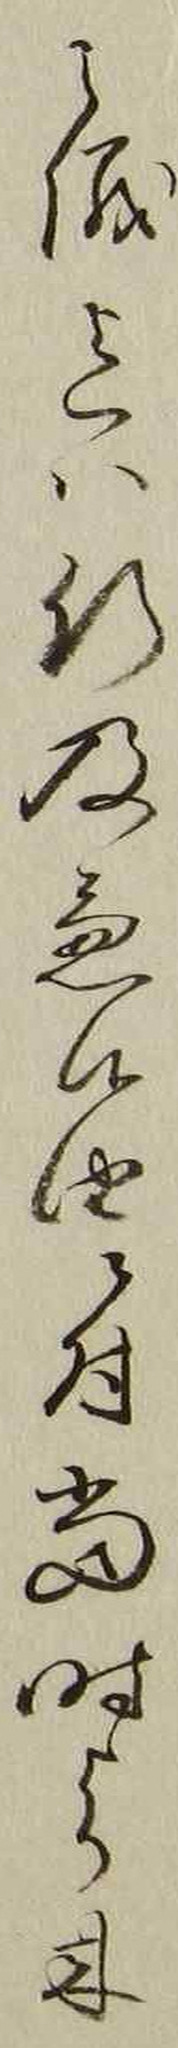之儀迄ハ行及兼候由ニ付当時より来
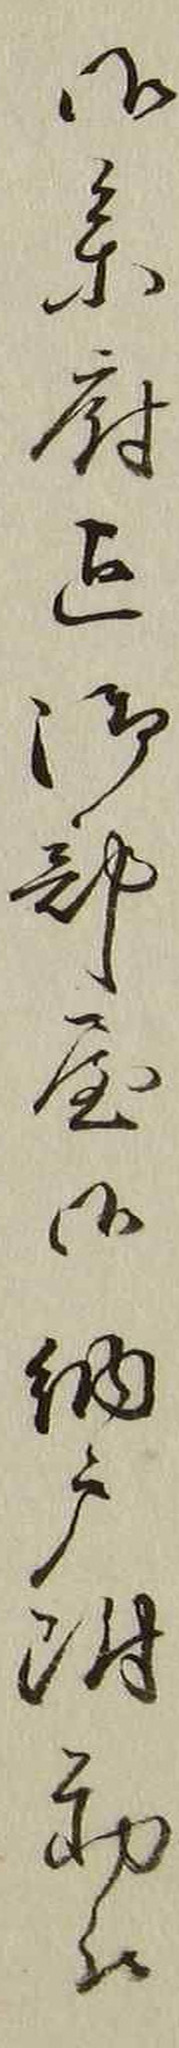御参府迄御部屋御納戸附勤被
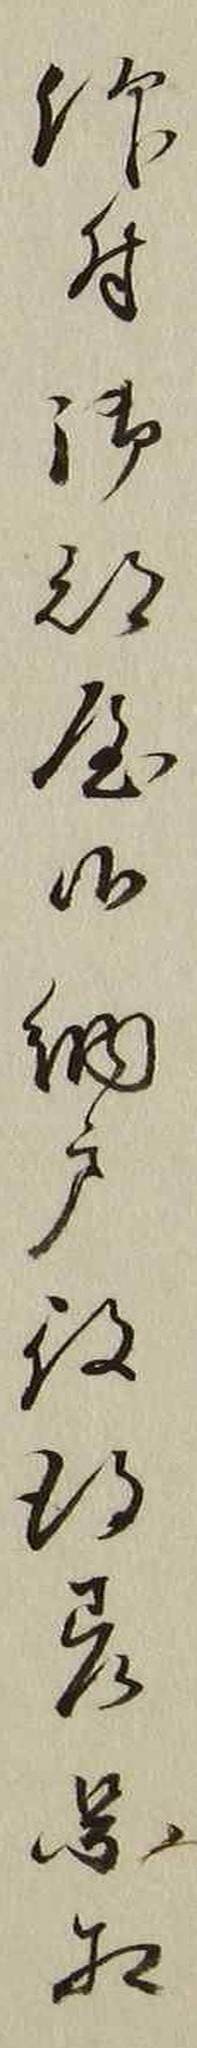仰付御部屋御納戸役得差図相
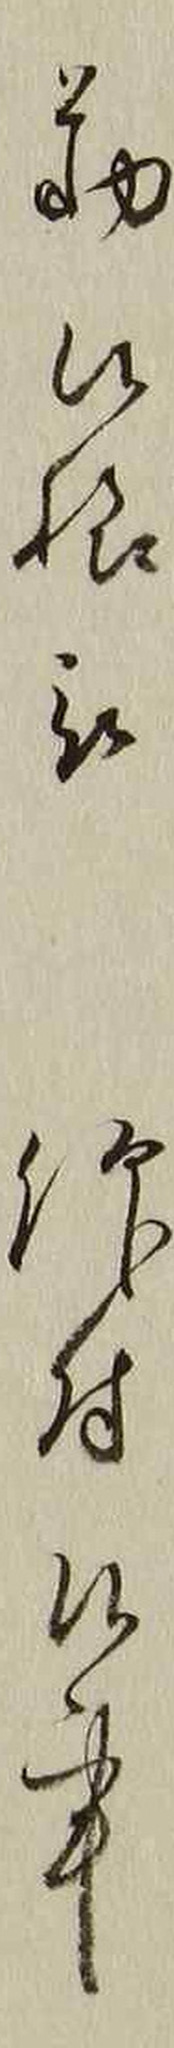勤候様被仰付候事
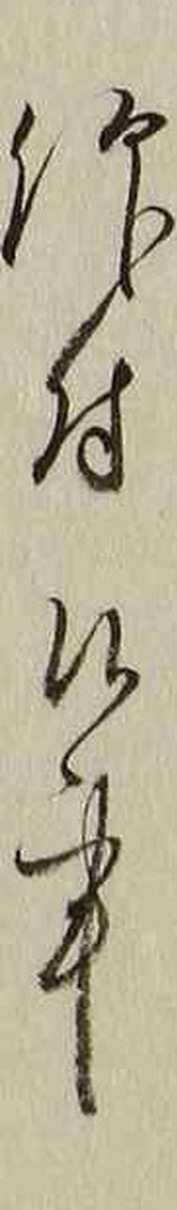仰付候事
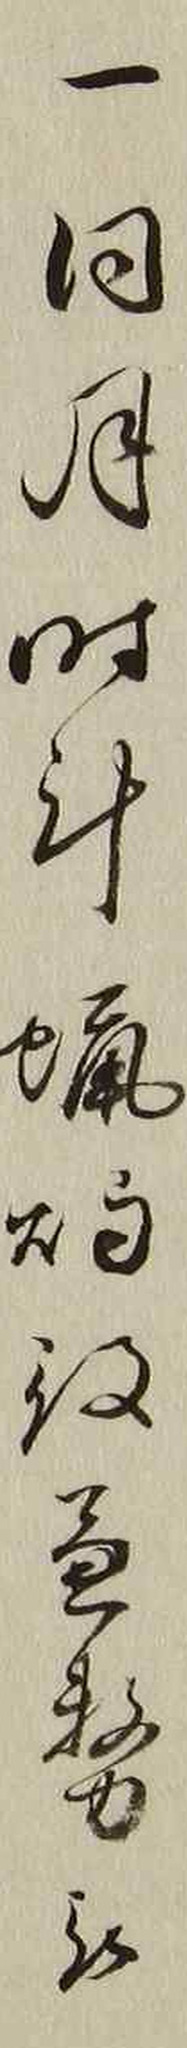一同月時計蠟燭役兼務被
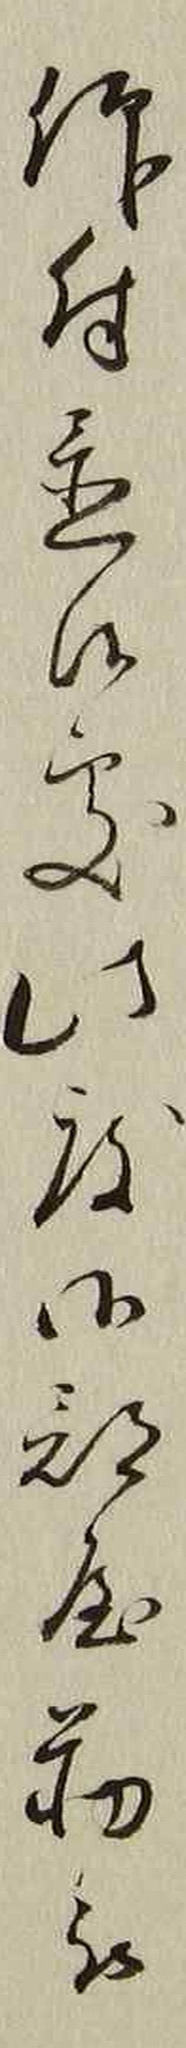仰付置候処此度御部屋勤被
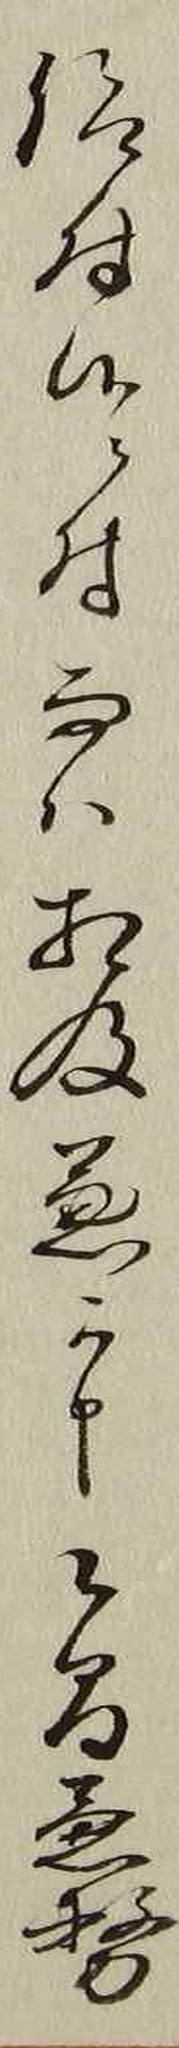仰付候ニ付而ハ相及兼可申候間兼務
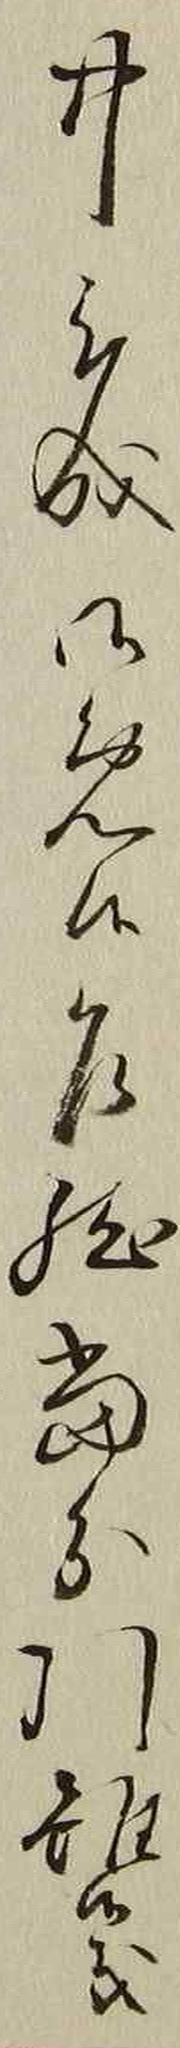中被成御免候乍然当分引難候義
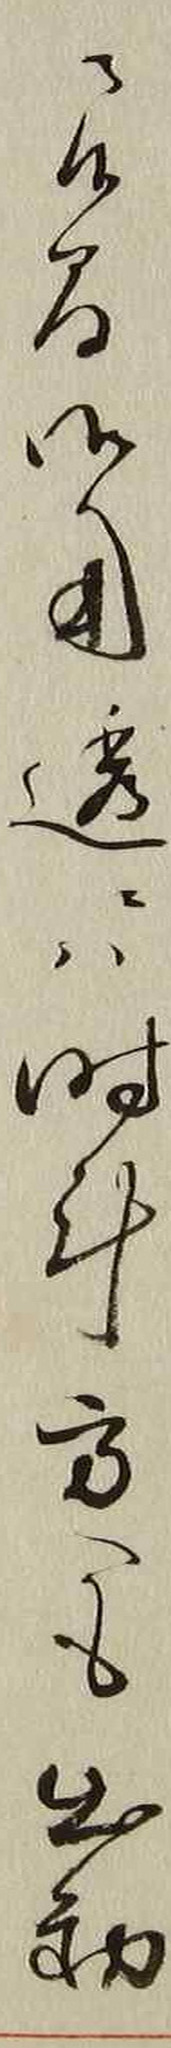ニ候間御用透ニハ時計方へも出勤
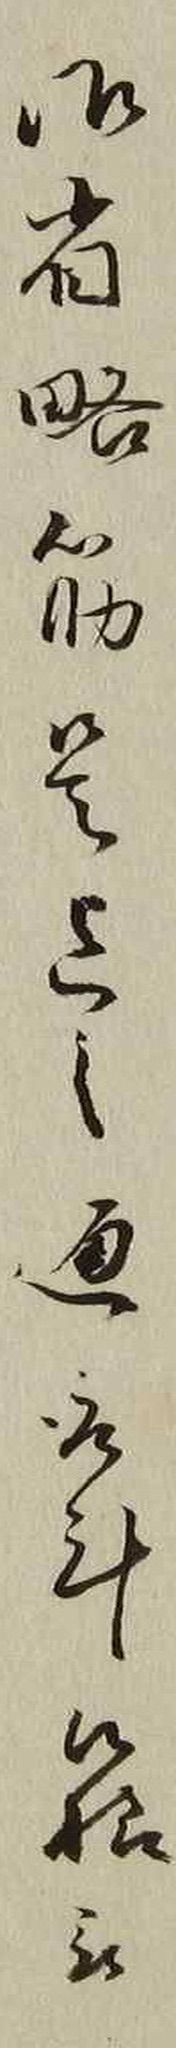御省略筋是迄之通取計候様被
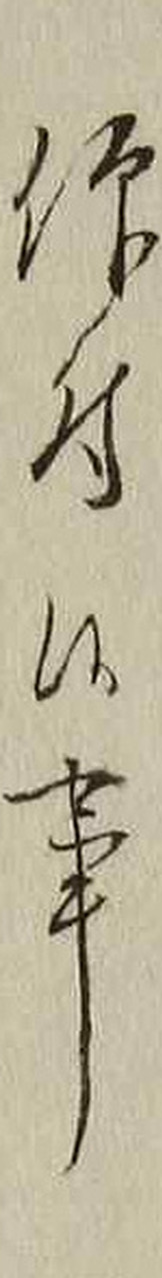仰付候事
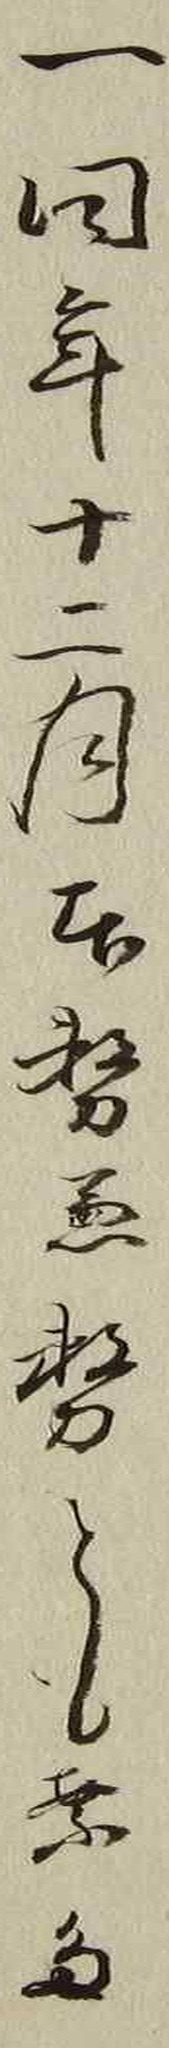一同年十二月本務兼務とも繁多
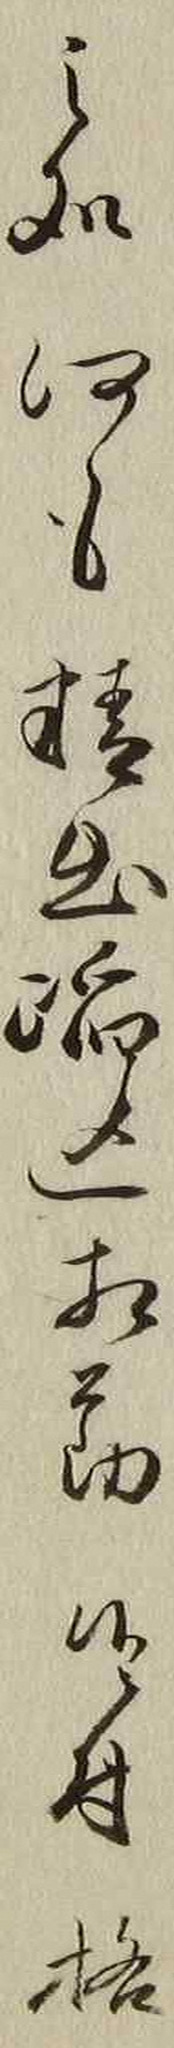之処何も精出踏込相勤候ニ付格
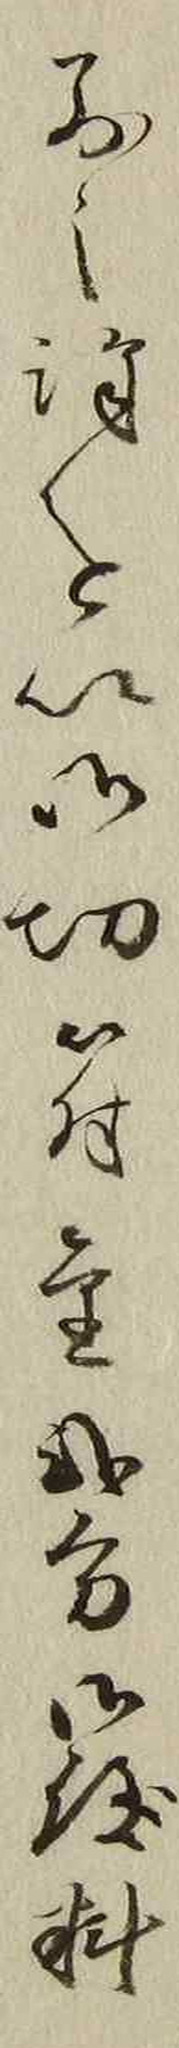別之訳を以御切符金弐分御役料
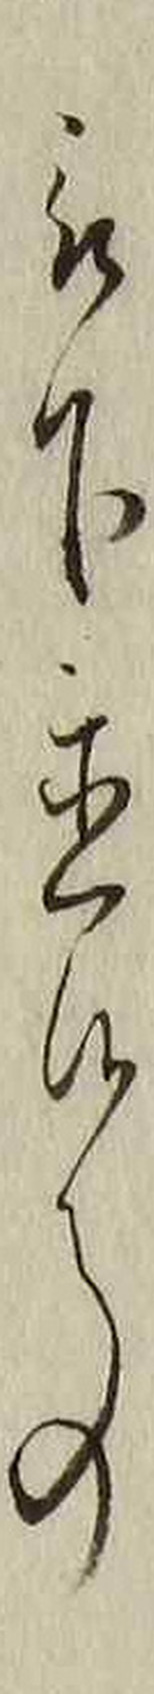被下置候事
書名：諸士系譜　巻之4　い之部4
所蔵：会津若松市立会津図書館
